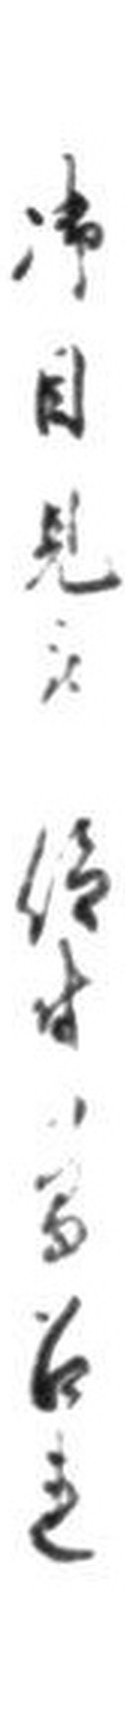御目見被仰付候間召連
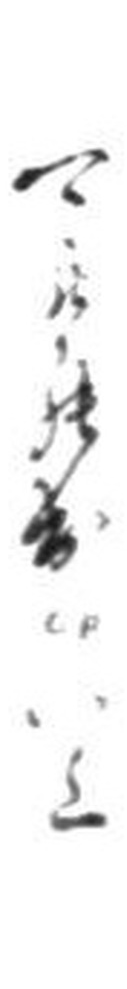可被罷出候以上
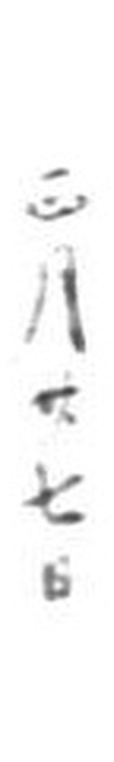正月廿七日
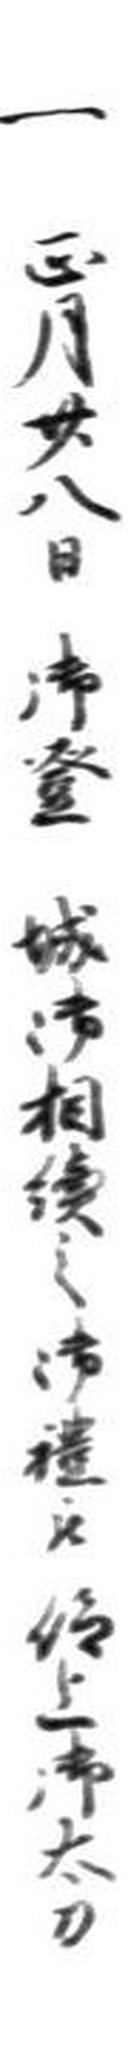一正月廿八日御登城相続之御礼被仰上御太刀
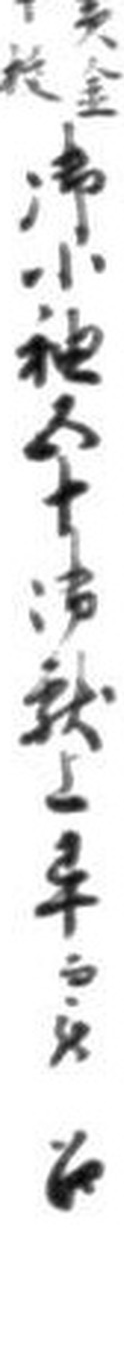五十枚御小袖五十御献上畢而被召
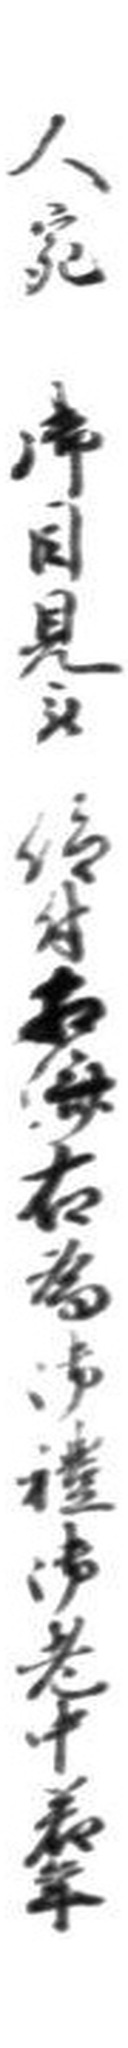人宛御目見被仰付相済右為御礼御老中若年

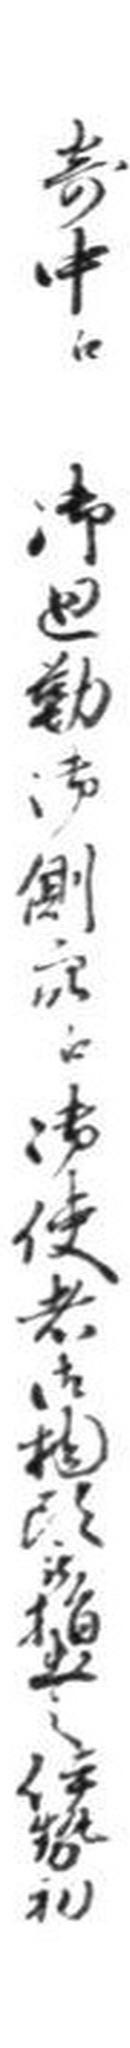寄中江御廻勤御側衆江御使者御物頭被指出之伊勢初
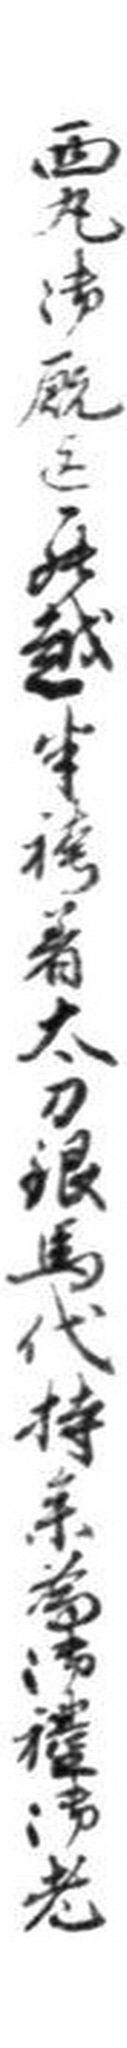西丸御厩迄罷越半袴着太刀銀馬代持参為御礼御老
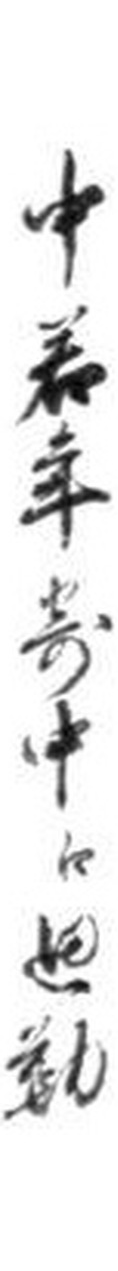中若年寄中江廻勤
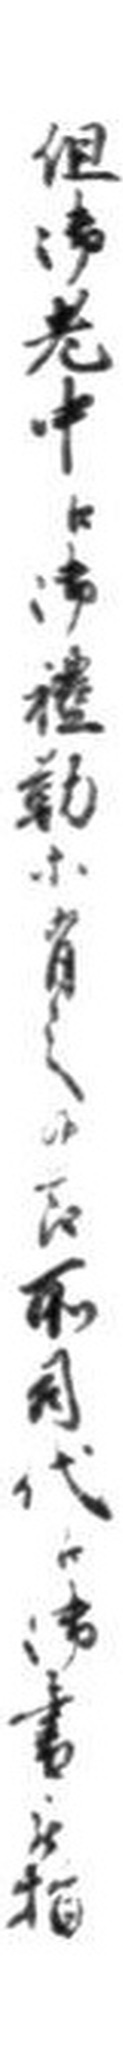但御老中江御礼勤等有之候節所司代江御書被指
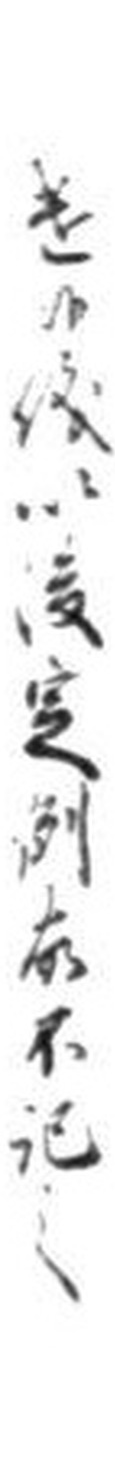遣候儀以後定例故不記之
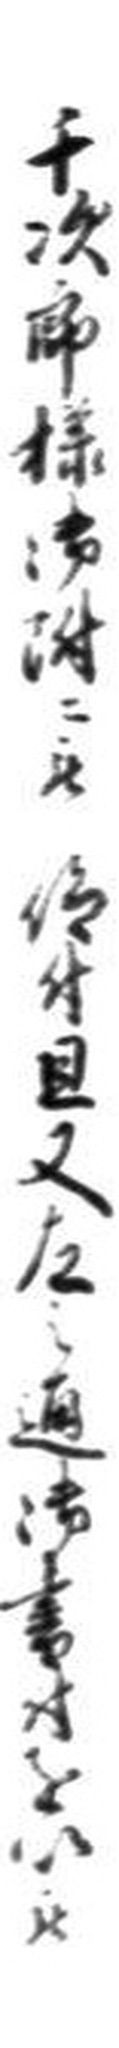千次郎様御附ニ被仰付且又左之通御書付を以被
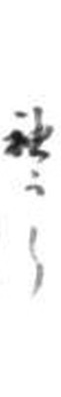袖うら
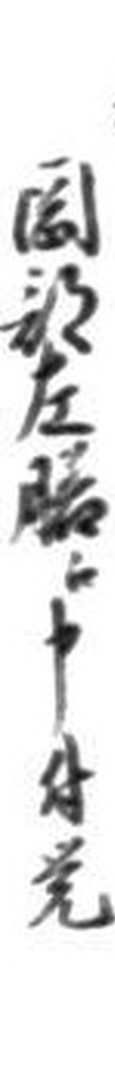岡部左膳江申付覚
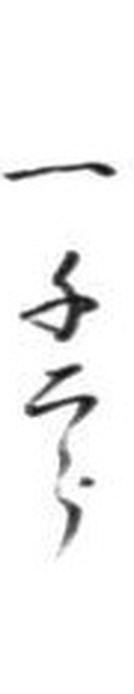一千二郎
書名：家譜 三十五 宗昌公 従享保六年到同七年
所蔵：福井県文書館 Fukui Prefectural Archives
